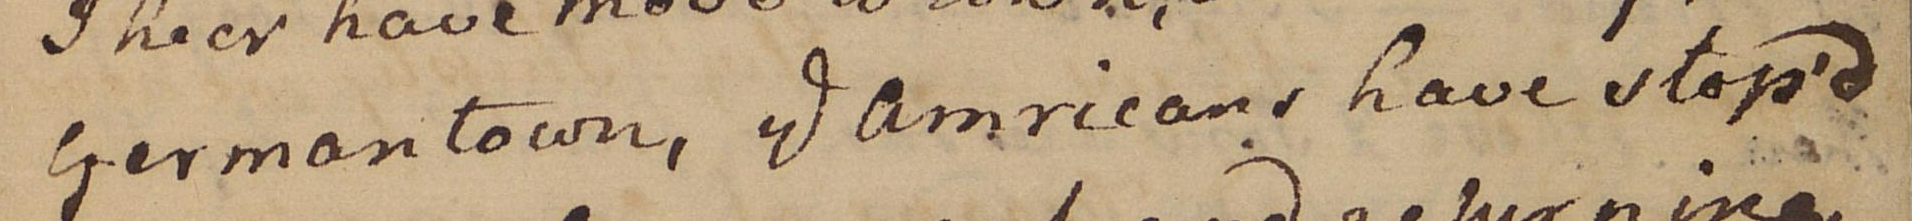Germantown, y^e Amricans have stop'd
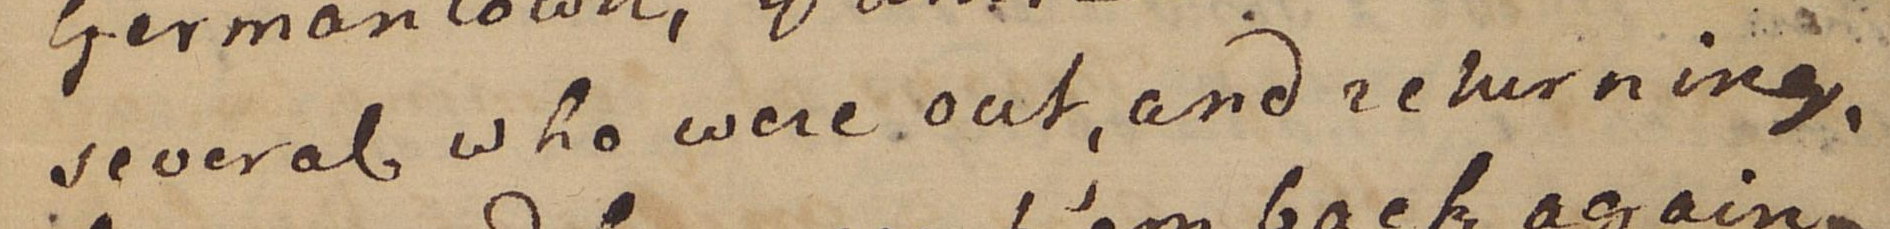several, who were out, and returning.
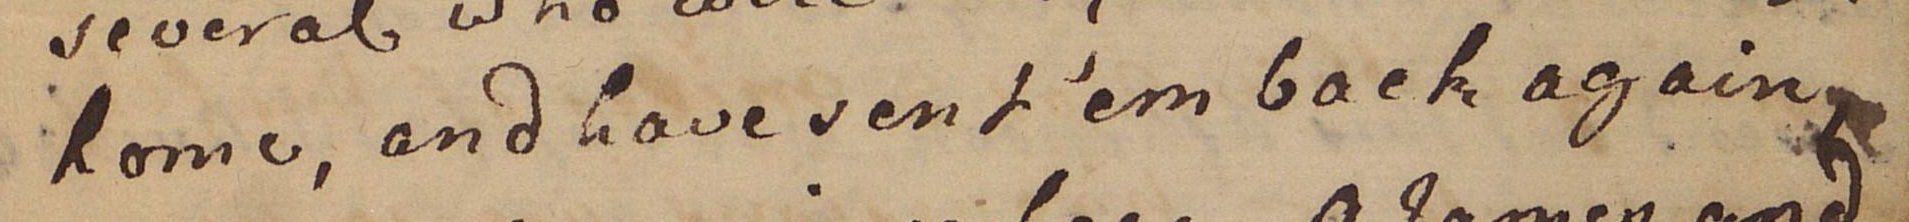home, and have sent 'em back again-
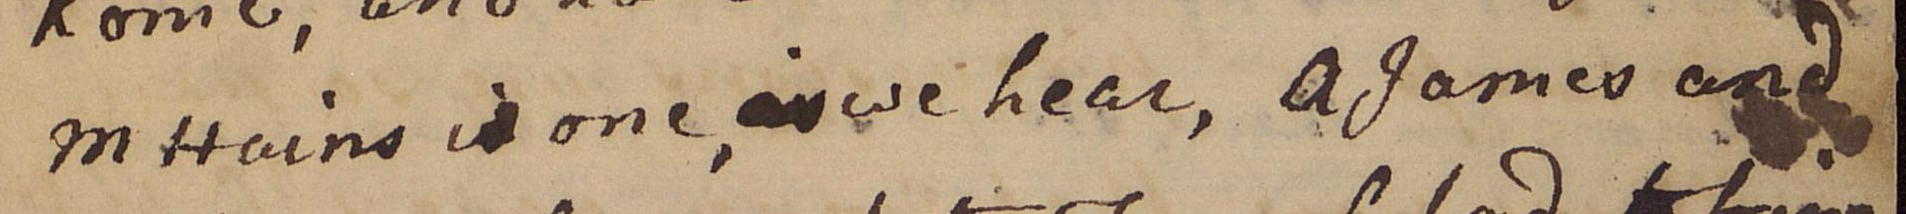M Hains is one, [as] we hear, A James and
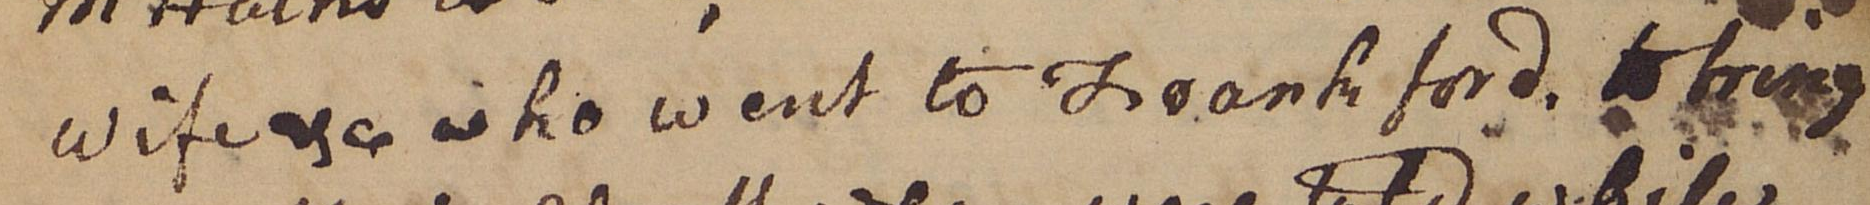Wife &c who went to Frankford, to bring
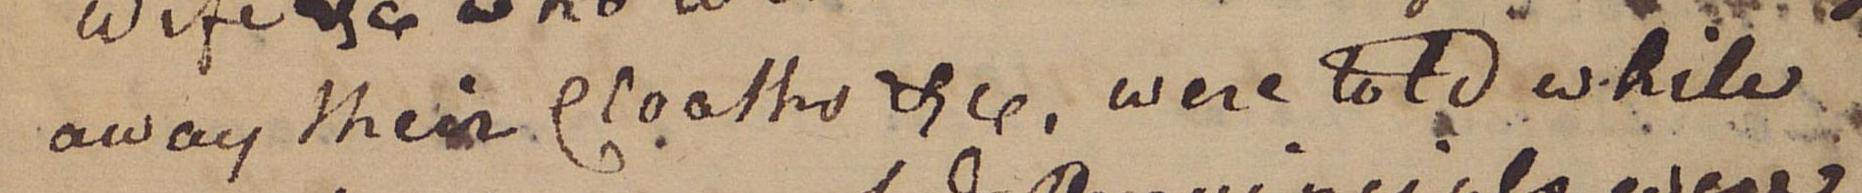away their Cloaths &c. were told while
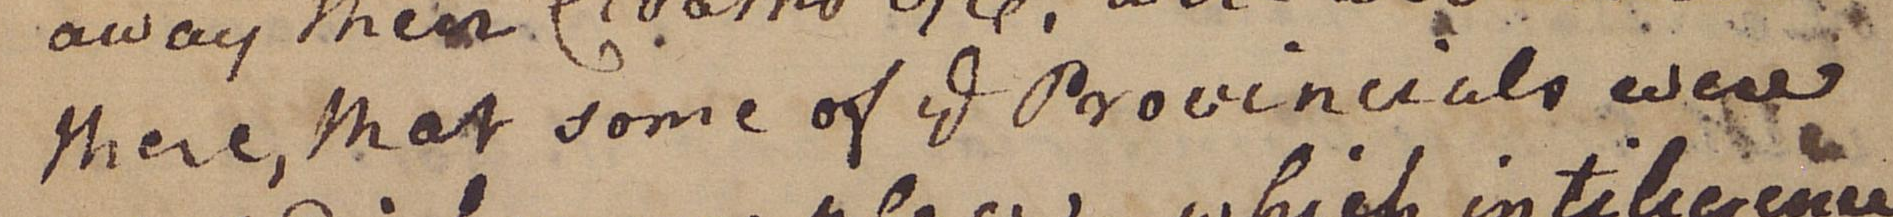there, that some of y^e Provincials were
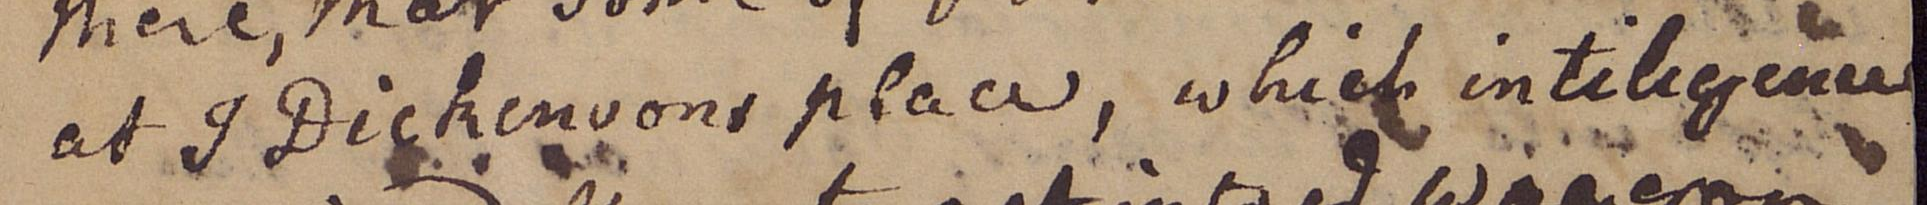at I Dickensons place, which intiligence
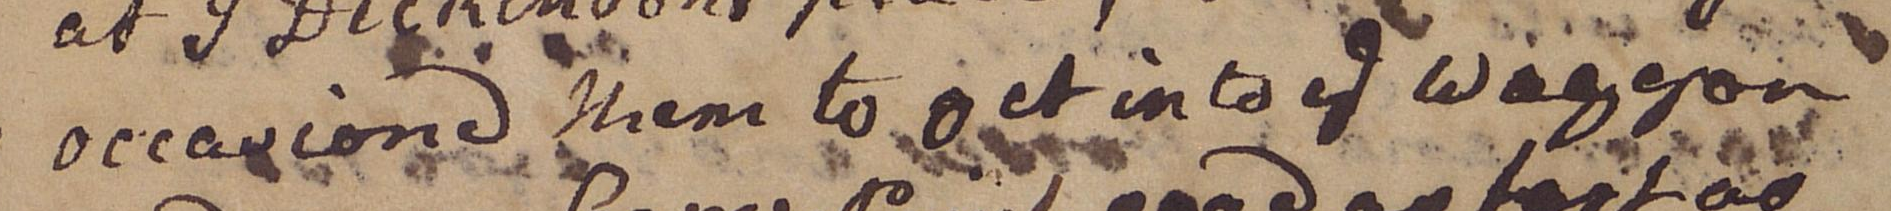occasiond them to get into y^e waggon
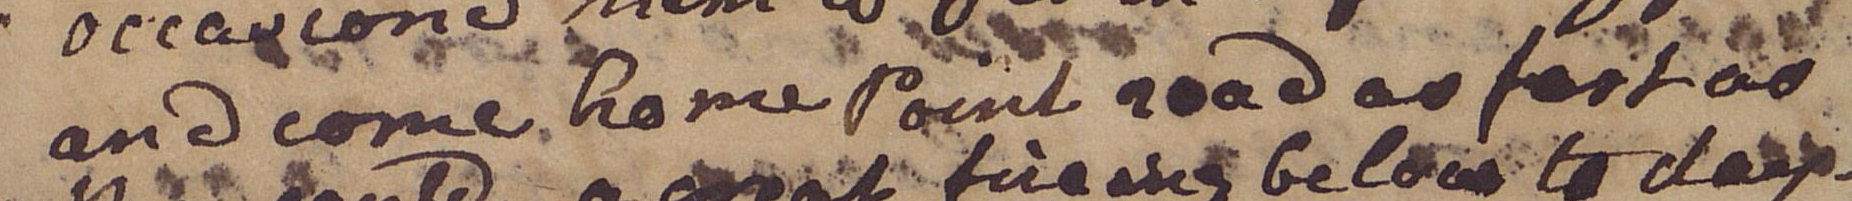and come home Point road as fast as
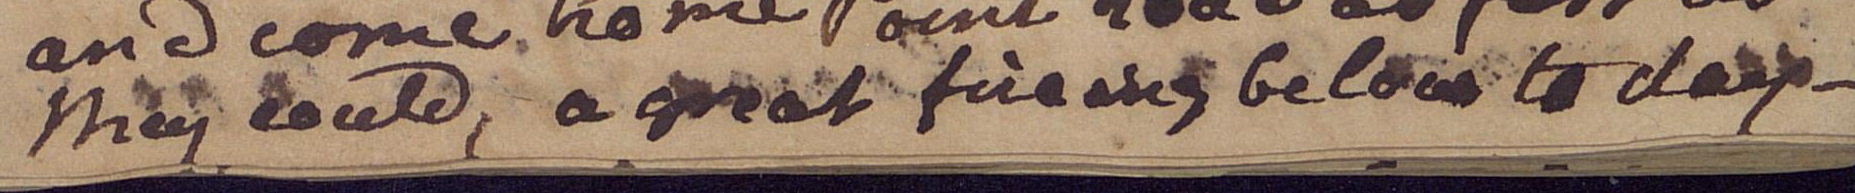they could, a great fireing below to day -
